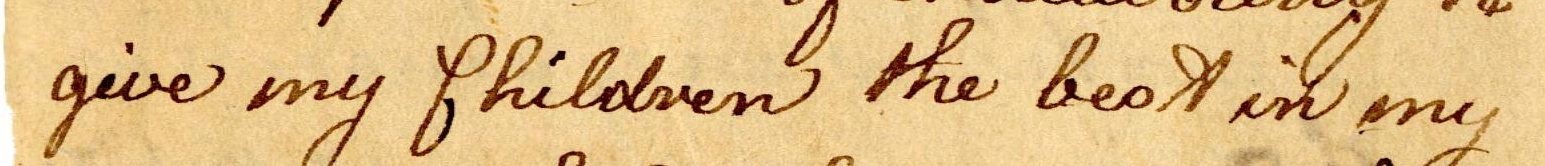give my Children the best in my
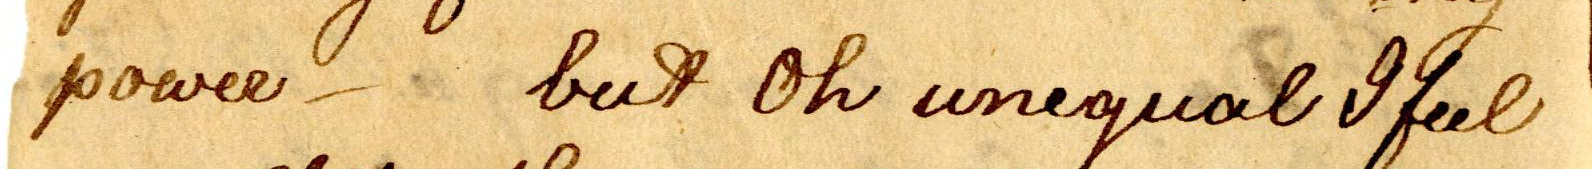power- but Oh unequal I feel
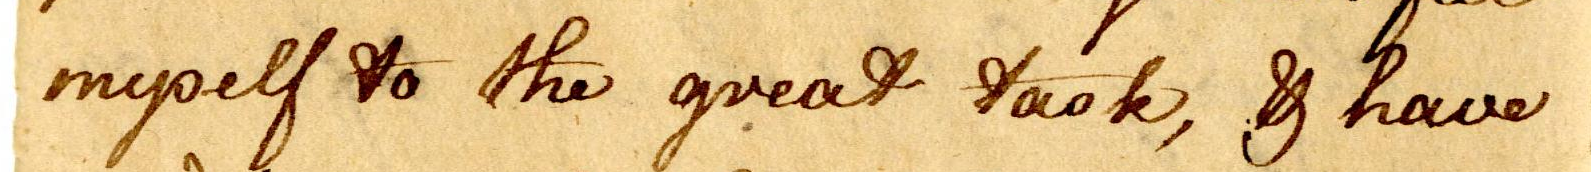myself to the great task, & have
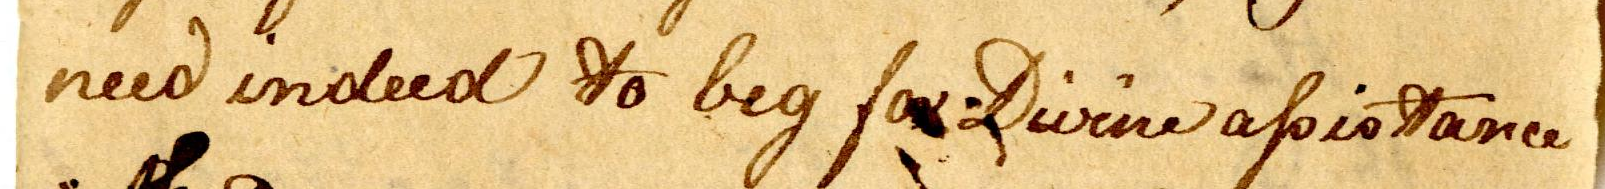need indeed to beg for Divine assistance
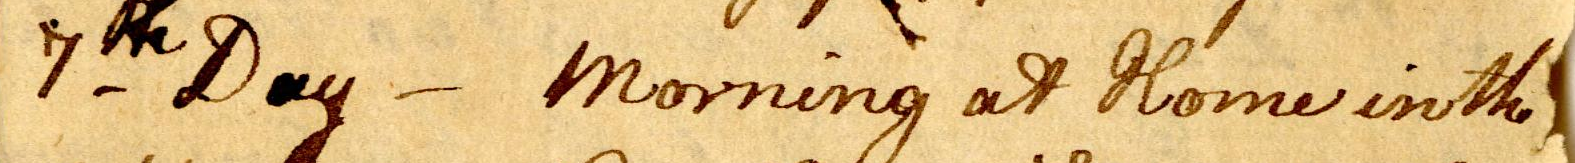7^th Day- Morning at Home in the
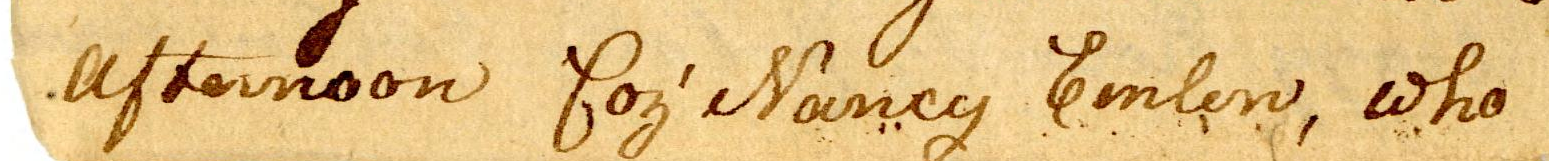Afternoon Coz' Nancy Emlen, who
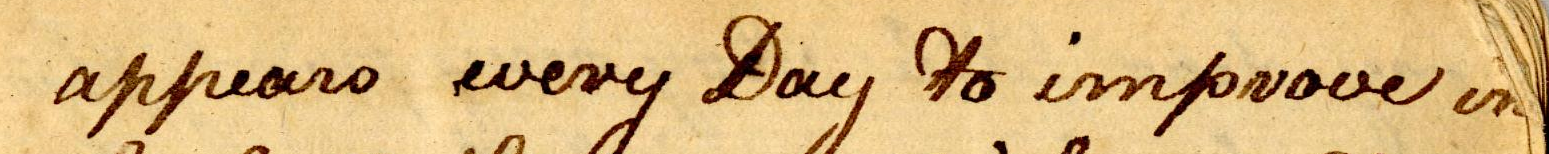appears every Day to improve in
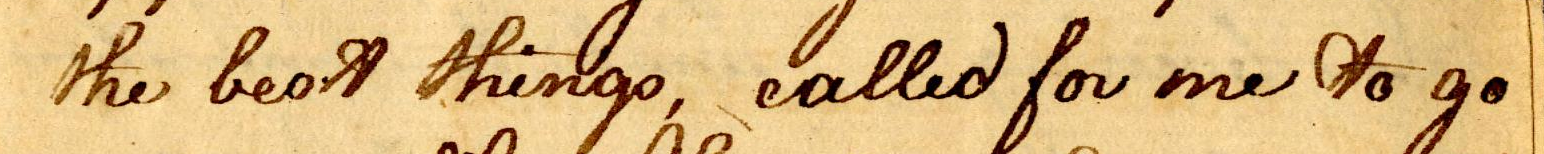the best things, called for me to go
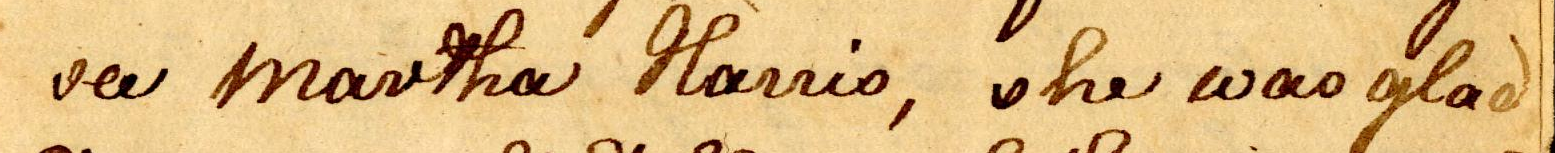see Martha Harris, she was glad
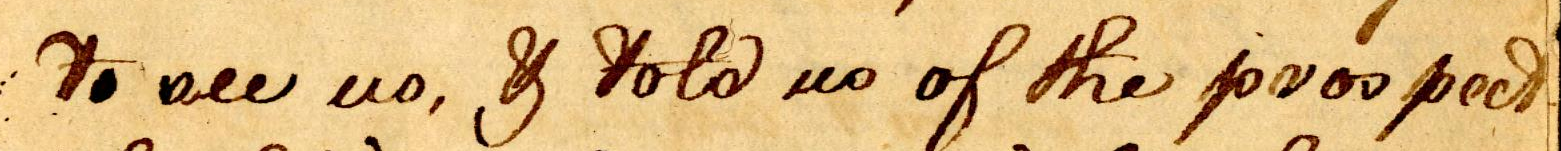to see us, & told us of the prospect
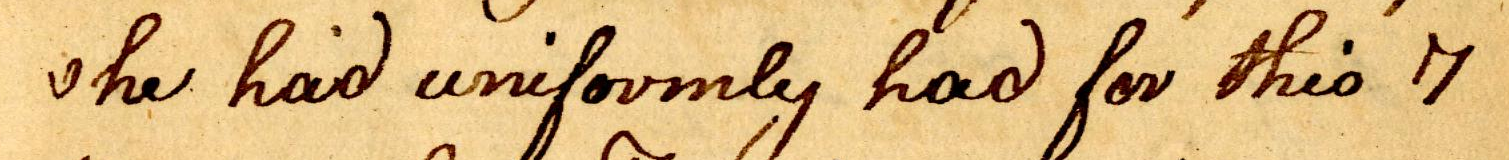she had uniformly had for this 7
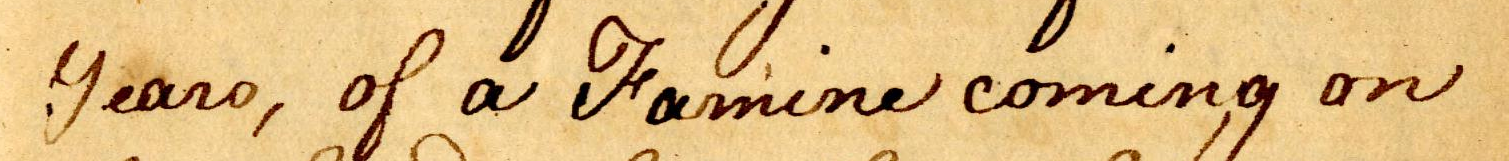Years, of a Famine coming on
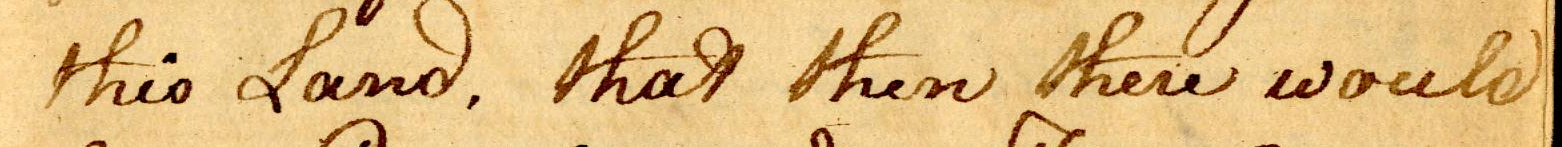this Land, that then there would
